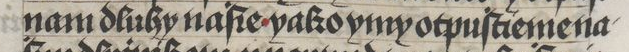nam dluhy naẛie.yako ymy otpuẛtieme na¬
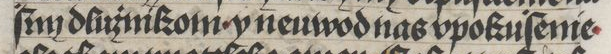ẛim dlużníkom.y neuwod nas vpokuẛenie.
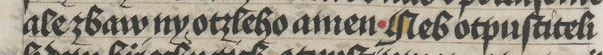ale zbaw ny otzleho amen.Neb otpuſtiteli
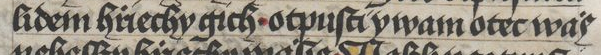lidem hṙíechy gich.otpuſti y wam otec waṡ
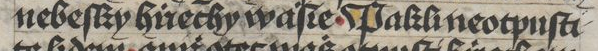nebeſky hṙiechy waẛie.Pakli neotpuſti¬
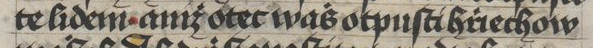te lidem.aniż otec waṡ otpuſtí hṙiechow
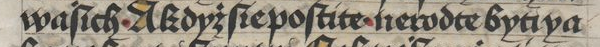waẛich.Akdyž ſíe poſtite.nerodte byti ya¬
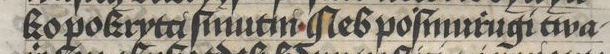ko pokrytci ſmutni.Neb poẛmuṙugí twa¬
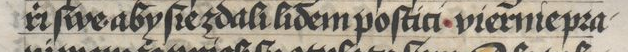ṙi ſwe.aby ſie zdali lidem poſtici.vierne pra¬
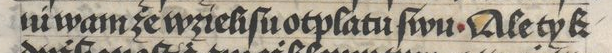ui wam że wzieli ſu otplatu ſwu.Ale ty k¬
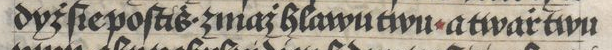dyż ſie poſtiṡ.zmaż hlawu twu.a twaṙ twu
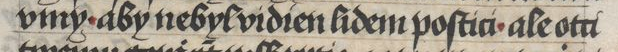viny.aby nebyl vidien lidem poſtici.ale otci
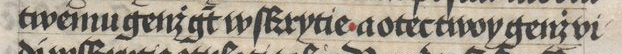twemu genż ḡt wſkrytie.a otec twoy genż vi¬
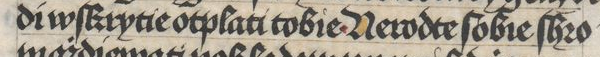dí wſkrytie otplati tobie.Nerodtre ſobie ſhro¬
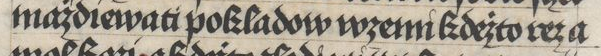mażdíewati pokladow wzemi kdeżto rez a
